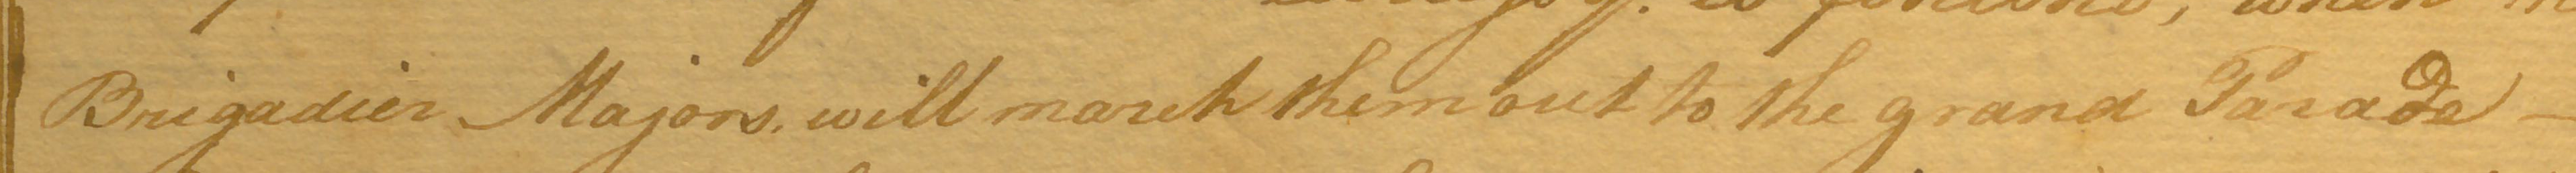Brigadier Majors will march them out to the grand Parade-
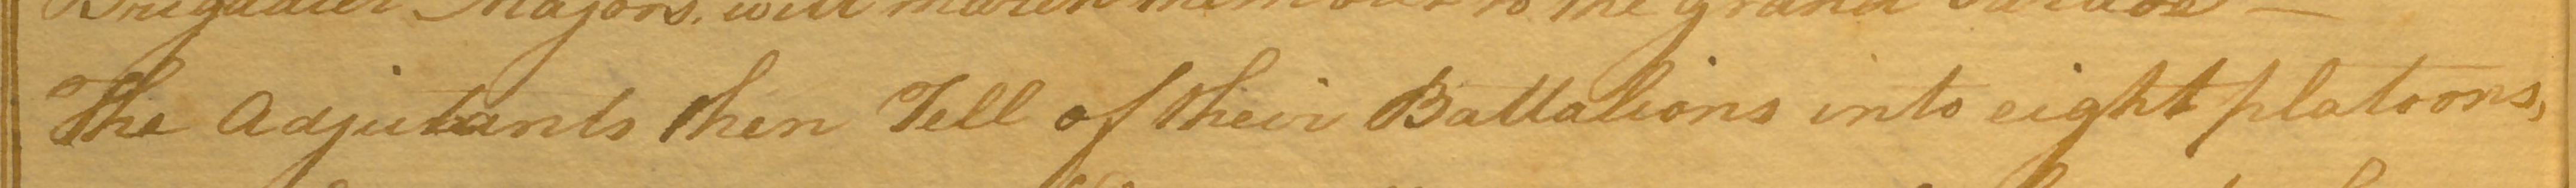The Adjutants then Tell of their Battalions into eight platoons
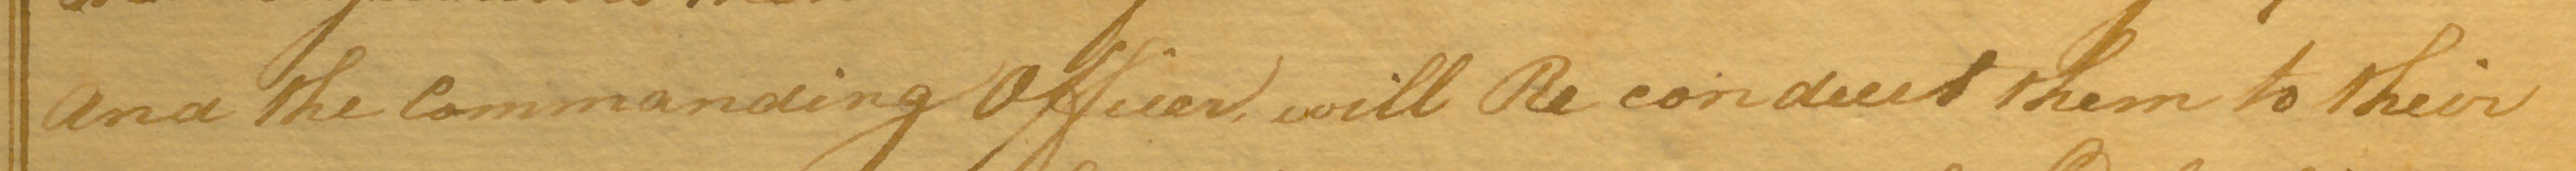and the Commanding Officer will Reconduct them to their
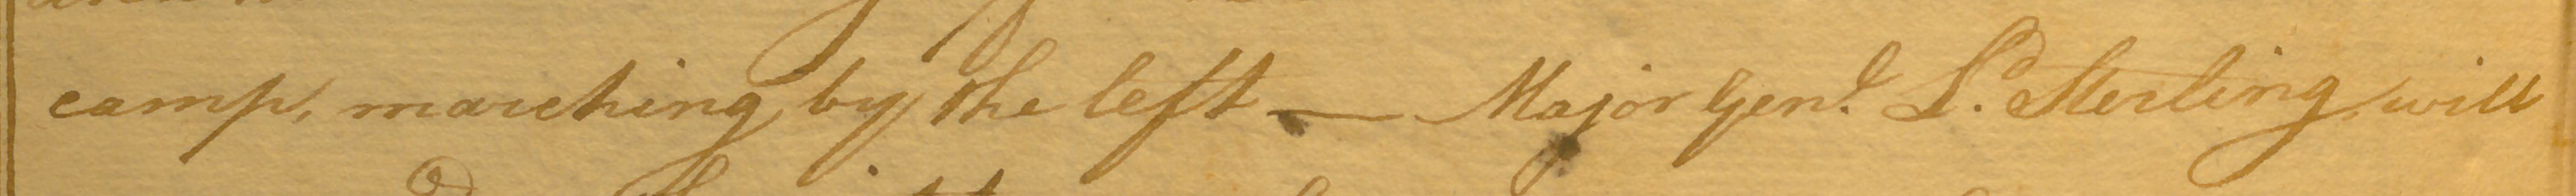camp, marching by the left- Major Gen^l L^d. Sterling will
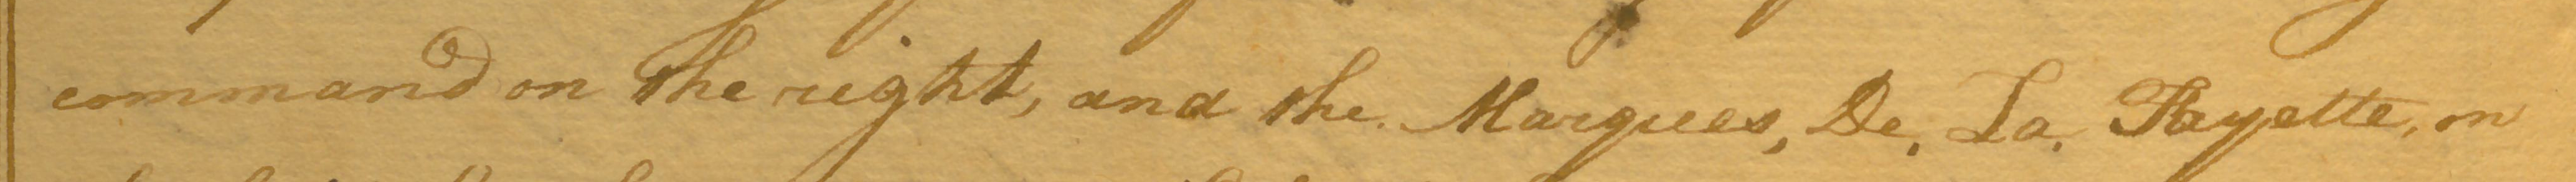command on the right, and the Marques De La Fayette on
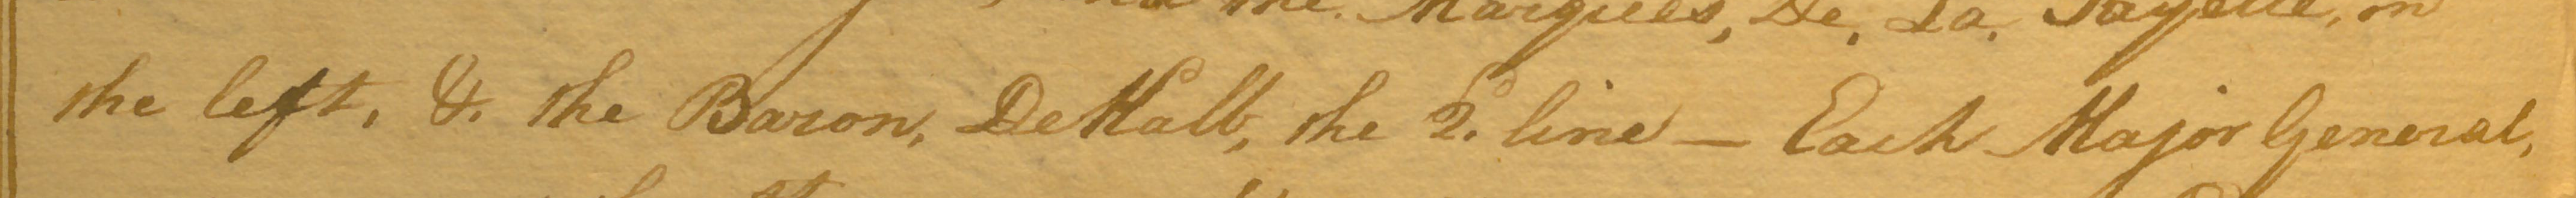the left, & the Barron DeKalb, the 2^d. line- Each Major General
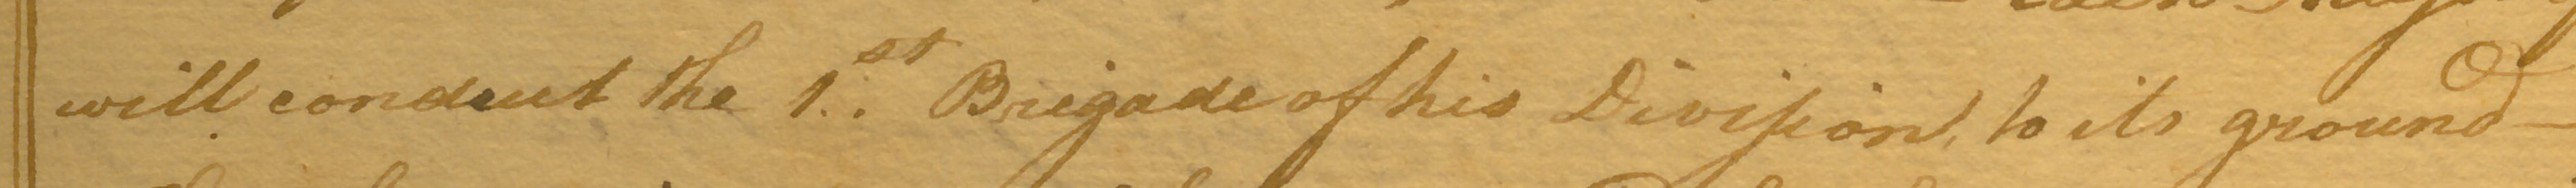will conduct the 1^st. Brigade of his Division to its ground-
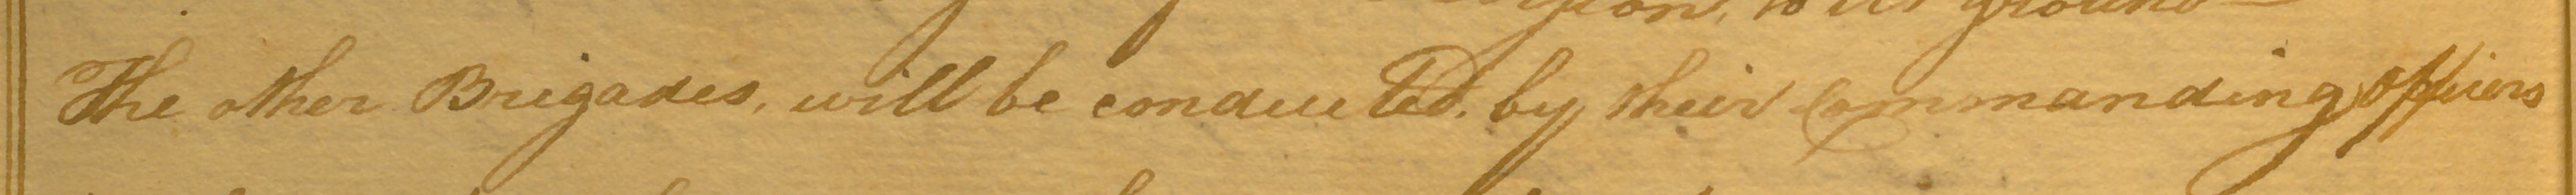The other Brigades will be conducted by their Commanding officers
